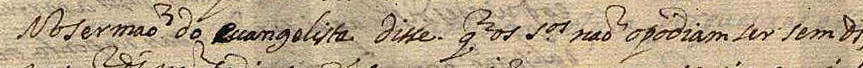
No sermaõ do euangelista disse q̄ os s.os não o podiam ser sem Ds̄,
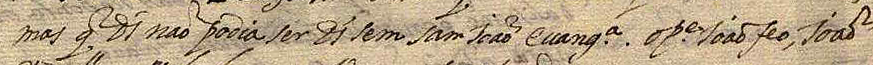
mas q̄ Ds̄ não podia ser Ds̄ sem sam Ioaõ euang.a o P.e Ioaõ feo, Ioaõ
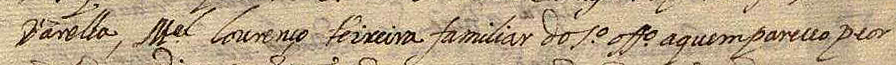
Varella, Mel Lourenço Teixeira familiar do s.o off.o a quem pareceo peor
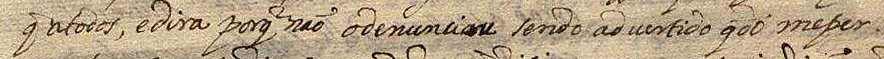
q̄ a todos, e dira porq̄ naõ o denunciou sendo aduertido q̄do me per
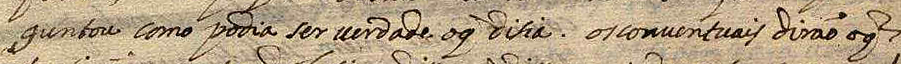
guntou como podia ser uerdade o q̄ disia. os conuentuais diraõ o q̄
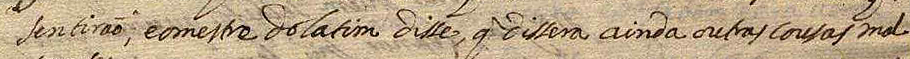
sentiraõ, e o mestre do latim disse, q̄ dissera ainda outras cousas mal
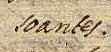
soantes.
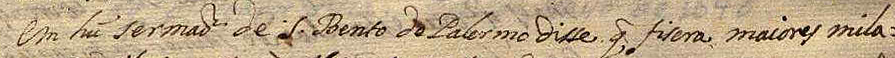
Em hū sermaõ de S. Bento de Palermo disse q̄ fisera maiores mila
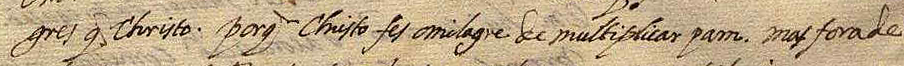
gres q̄ Christo. porq̄ Christo fes o milagre de multiplicar pam. mas fora de
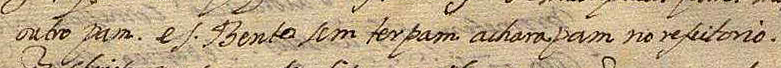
outro pam. e S. Bento sem ter pam achara pam no refeitorio.
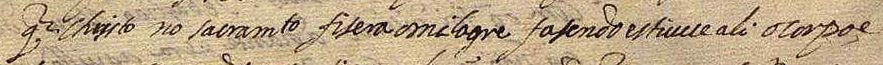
q̄ Christo no sacramto fisera o milagre fasendo estiuese ali o corpo e
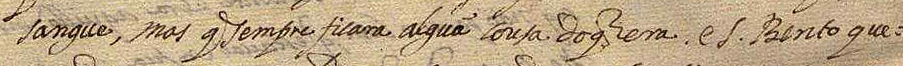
sangue, mas q̄ sempre ficara alguā cousa do q̄ era. e S. Bento que
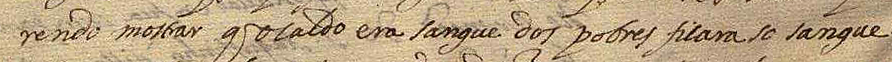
rendo mostrar q̄ o caldo era sangue dos pobres ficara so sangue
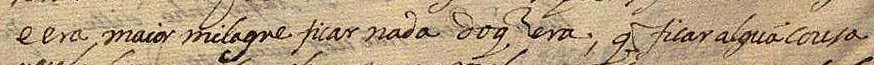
e era maior milagre ficar nada do q̄ era, q̄ ficar alguā cousa
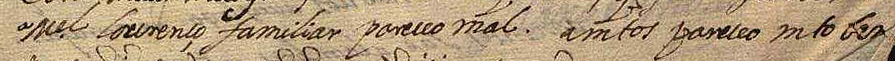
a Mel Lourenço familiar pareceo mal. amtos pareceo mto be
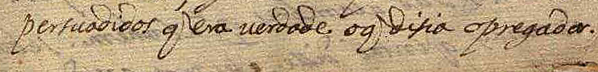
persuadidos q̄ era uerdade o q̄ disia o pregador.
